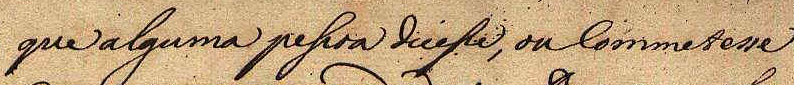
que alguma pessoa dicesse, ou Commetesse
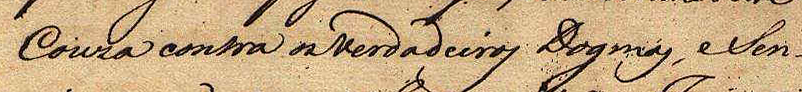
Couza contra os verdadeiros Dogmas, e Sen
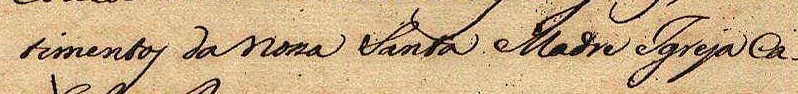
timentos da nossa Santa Madre Igreja Ca
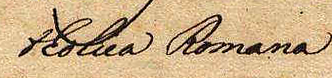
tholica Romana
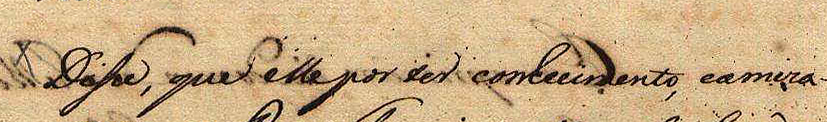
Disse, que elle por ter conhecimento, e amiza
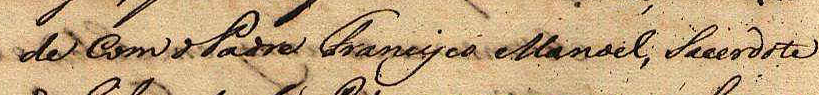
de com o Padre Francisco Manoel, Sacerdote
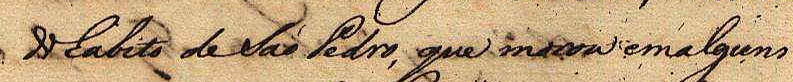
do habito de Saõ Pedro, que morou em alguns
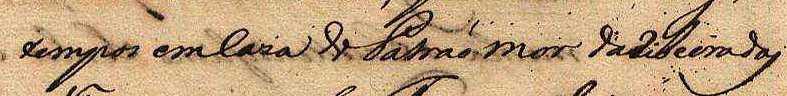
tempos em Caza do Patraõ mor da Ribeira das
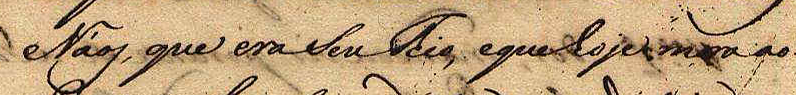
Náos, que era Seu Thio, e que hoje mora ao
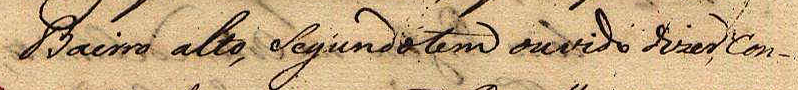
Bairro alto, segundo tem ouvido dizer, con
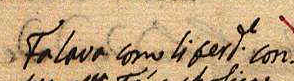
Falava como liberd.e con
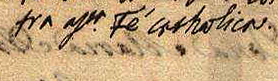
tra a s.ta Fé catholica.
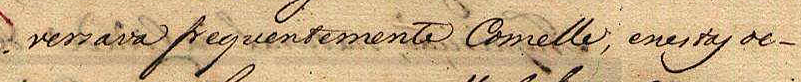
versava frequentemente Com elle, e nestas oc
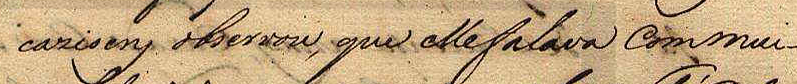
cazioens observou, que elle falava com mui
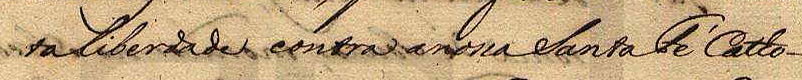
ta Liberdade contra a nossa Santa Fé Catho
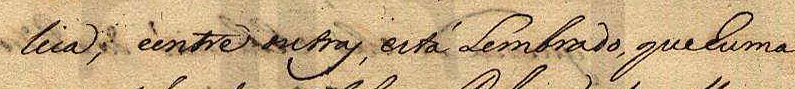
lica; e entre outras, está Lembrado, que huma
